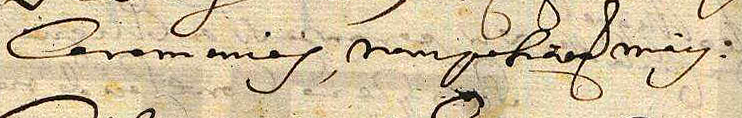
Ceremonias, nem passaraõ mais:
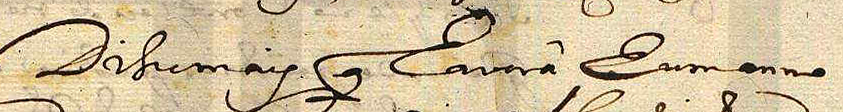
Disse mais q̄ haverá hum anno
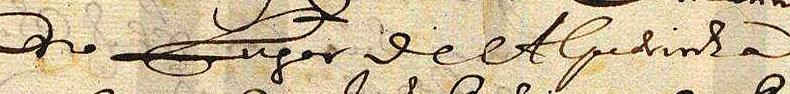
no Lugar de Alpedrinha
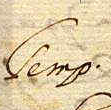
Temp.
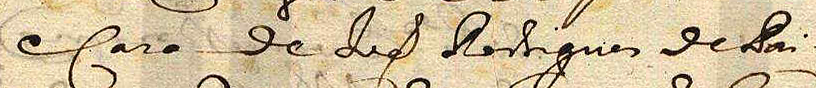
e Caza de Ioaõ Rodrigues de Pai
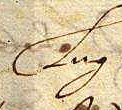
Lug.
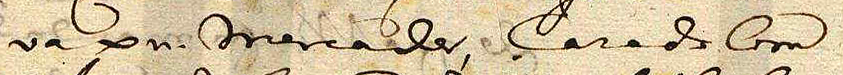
va xn. mercador, Cazado Com
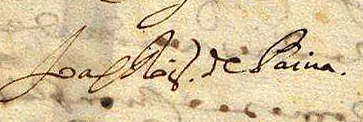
Joaõ Rois̄ de Paiua.
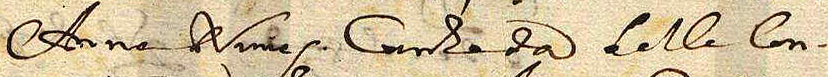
Anna Nunes. Cunhada delle Con
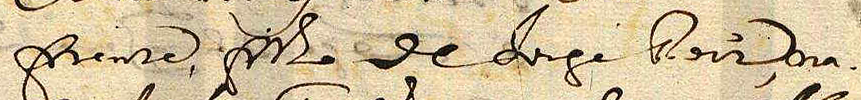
fitente, filho de Iorge Roiz̄, na
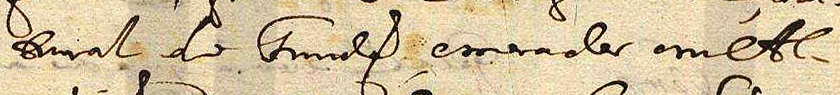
tural do Fundaõ, e morador em Al
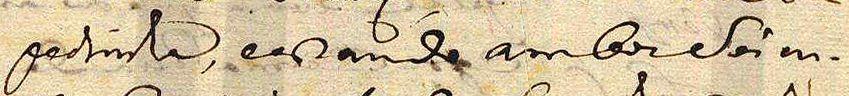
pedrinha, e estando ambos Sós en
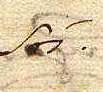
sós.
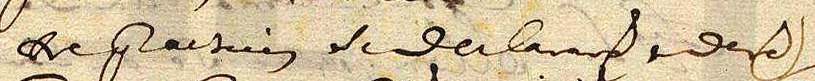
tre pRacticas se declararaõ, e deraõ
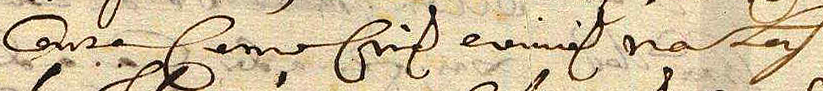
Conta Como Criaõ e viuiaõ na Ley
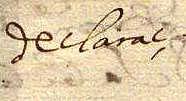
declaraç
